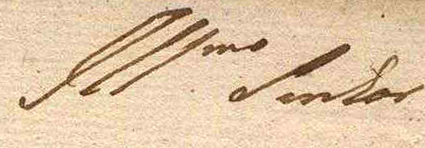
Ill.mo Senhor
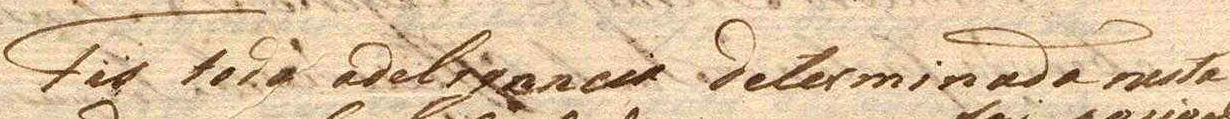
Fis toda a delignncia determinada nesta
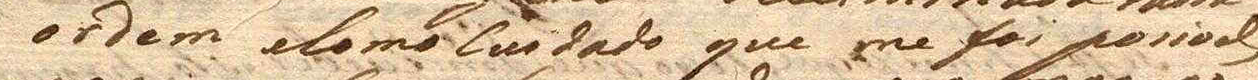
ordem e Com o cuidado que me foi possivel,
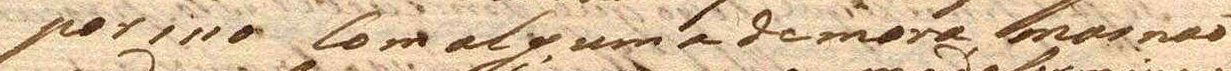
por isso Com alguma demora mas naõ
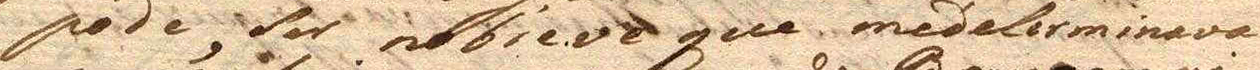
pode ser no breve que me determinava
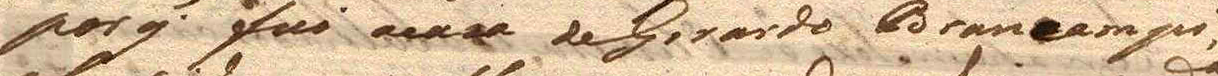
porq̄ fui a caza de Gerardo Brancampi,
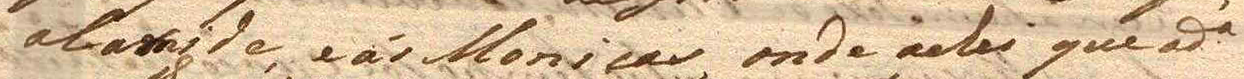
a Carnide, e ás Monicas, onde achei que a d.a
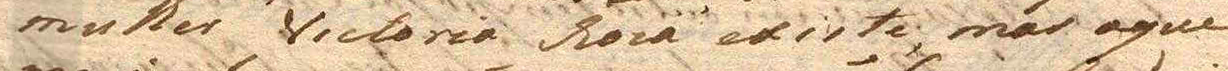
mulher Victoria Roza existe, mas o que
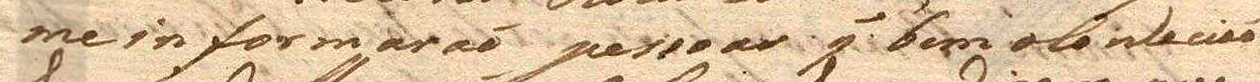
me informaraõ pessoas q̄ bem o Conheciaõ
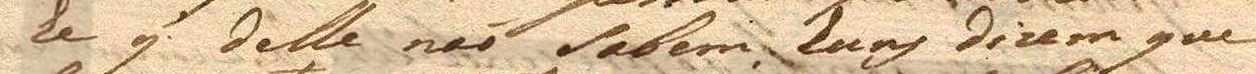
he q̄ delle naõ sabem, huns dizem que
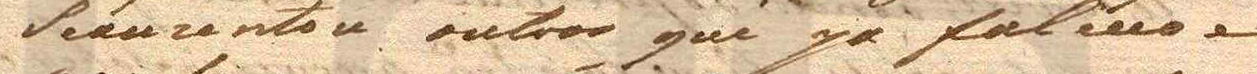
se auzentou outros que já faleceo e
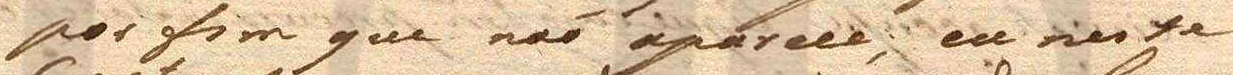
por fim que naõ aparece; eu neste
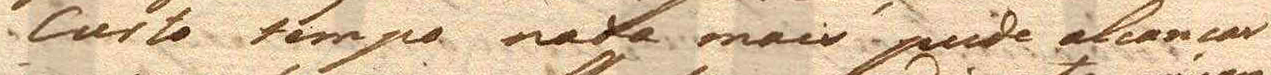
Curto tempo nada mais pude alcançar
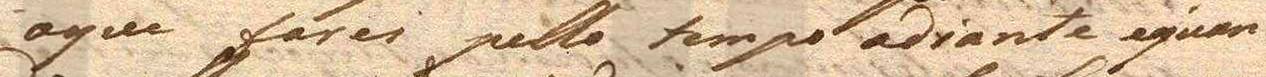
o que farei pello tempo adiante e quan
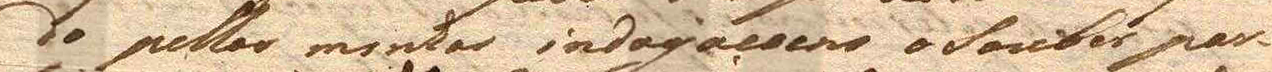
do pellas minhas indagaçoens o souber par
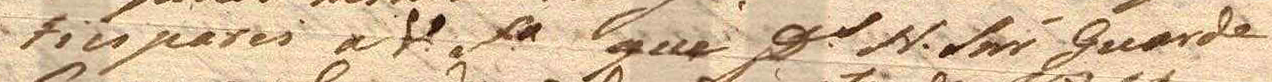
ticiparei a V. S.a que D.s N. Snr̄ Guarde
